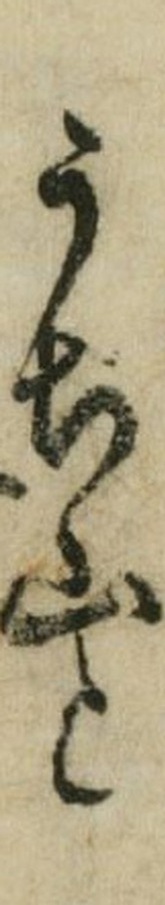うぢ山と
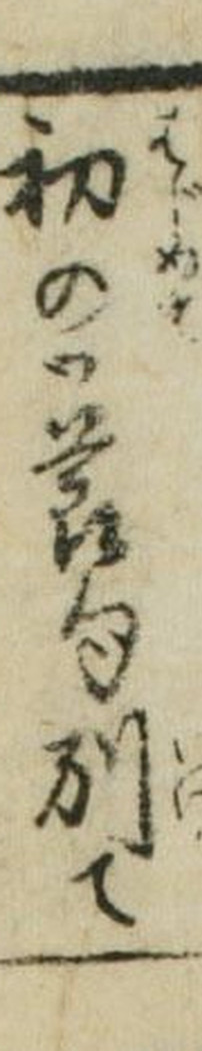初の節句別て
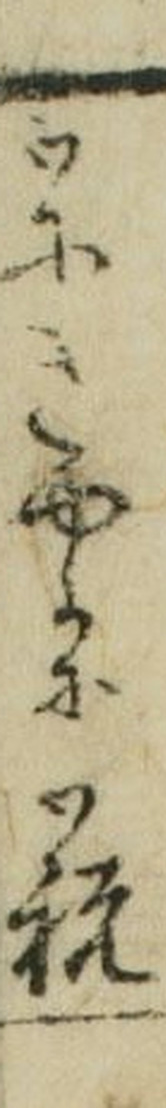御にきやかに御祝
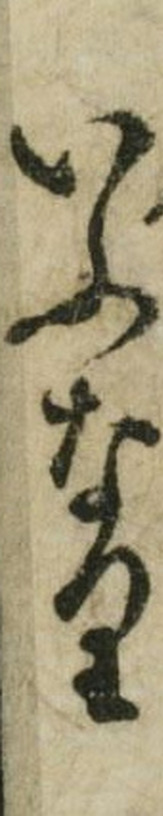いふなり
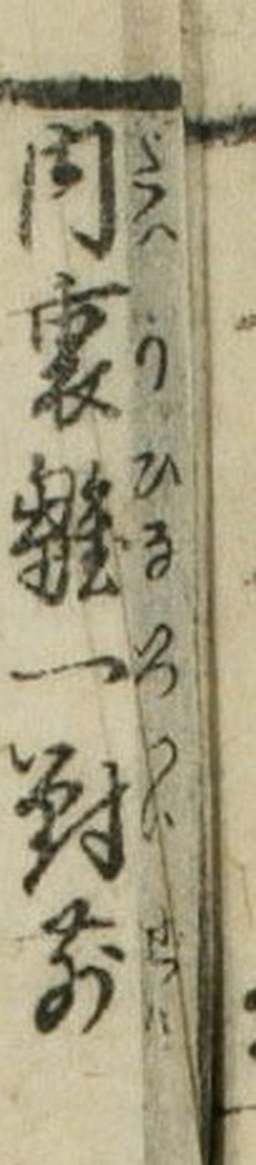内裏雛一対前
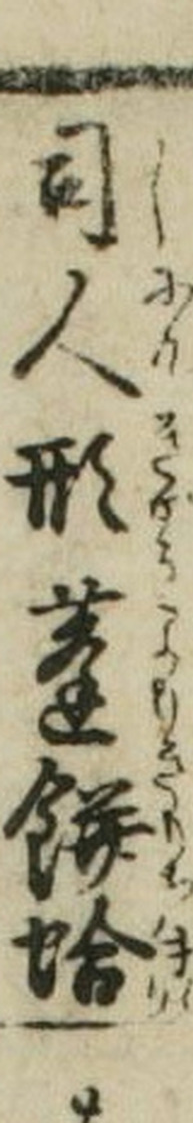司人形蓬餅蛤
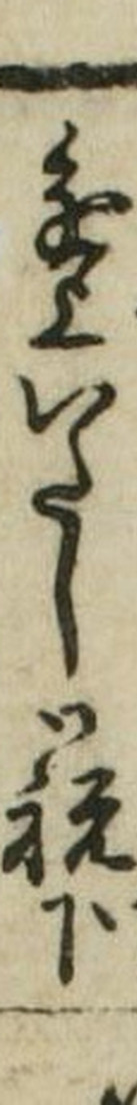進上いたし御祝下
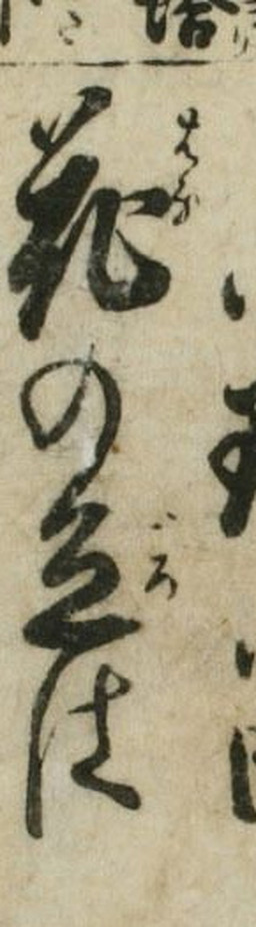花の色は
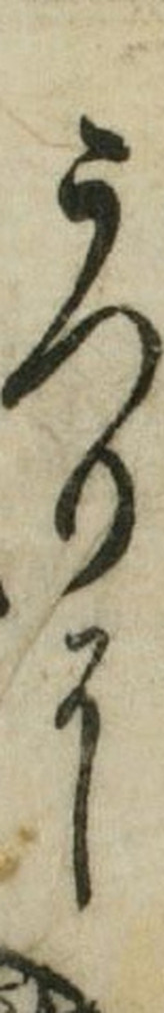うつりに
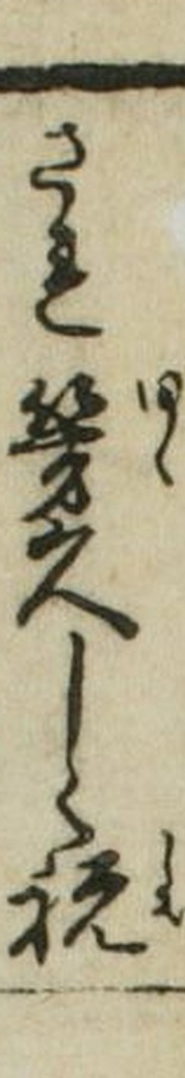され幾久しく祝
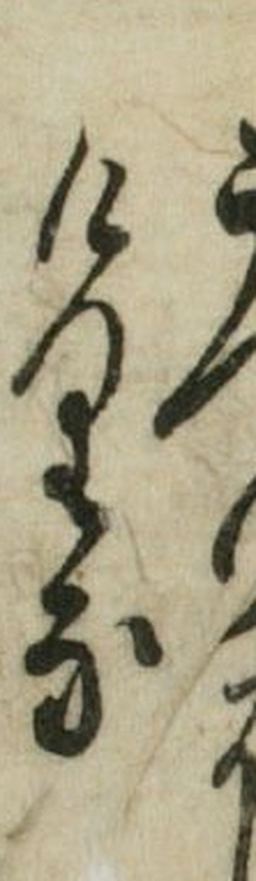けりな
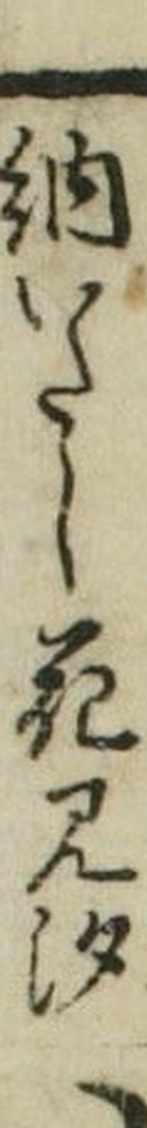納いたし花見汐
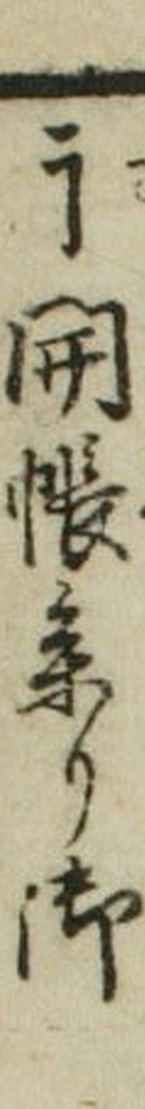干開帳参り御
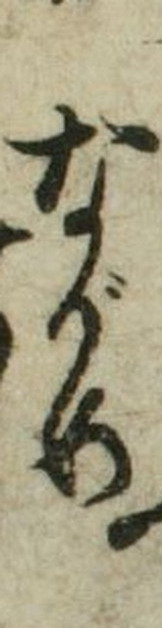ながめ

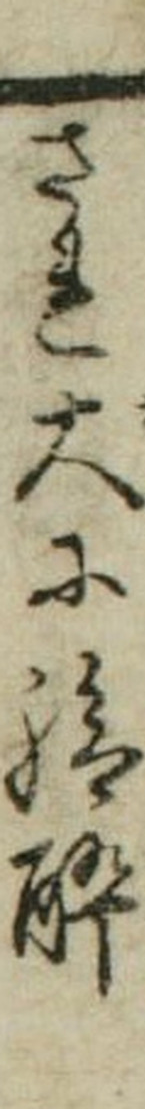され大に絶醉
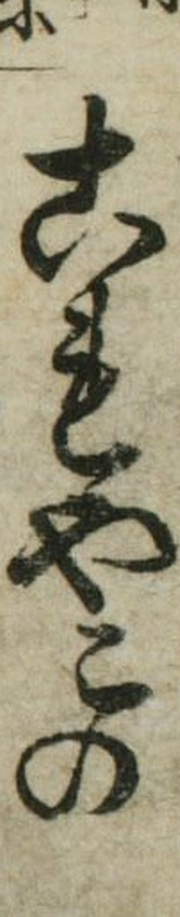これやこの
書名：百人一首
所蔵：東京学芸大学教育コンテンツアーカイブ
